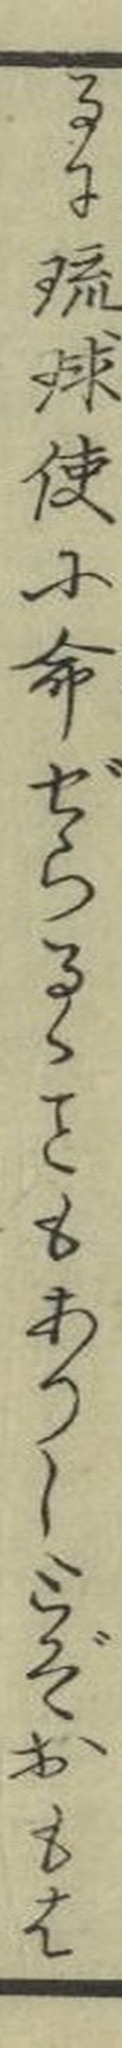るに、琉球使に命ぜらるゝこともありしとぞおもは
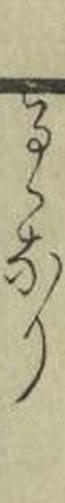るゝなり
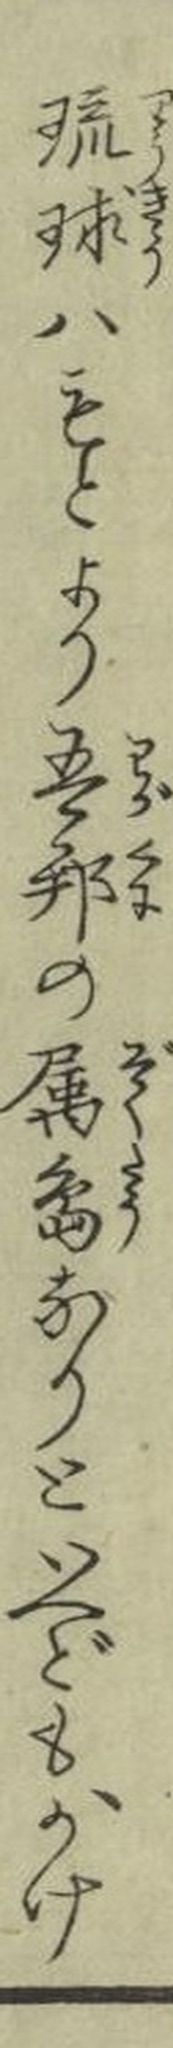琉球はもとより吾邦の属島なりといへども、かけ
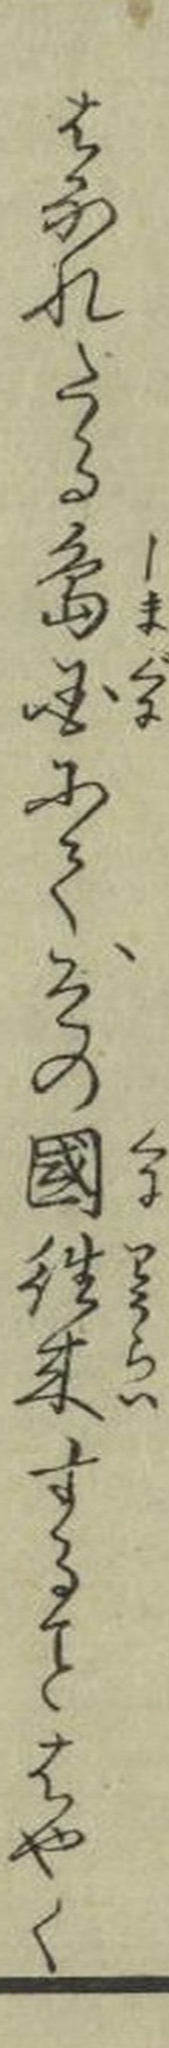はなれたる島国にて、その国往来することはやく
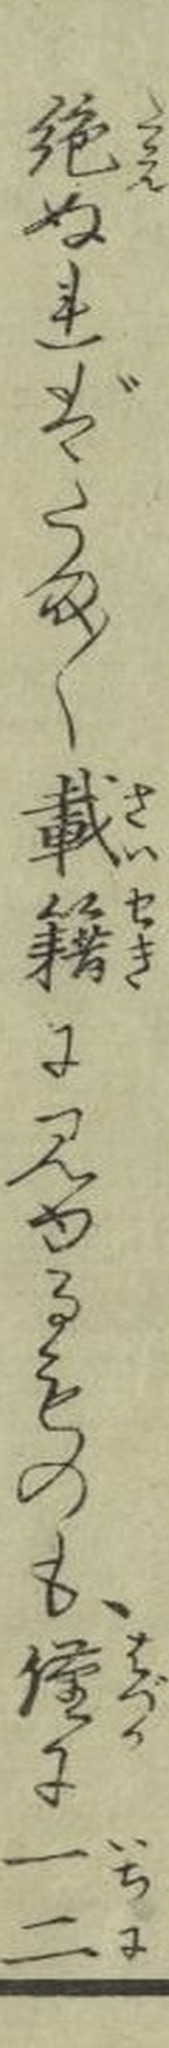絶ぬればたま〳〵載籍に見ゆるものも、僅に一二
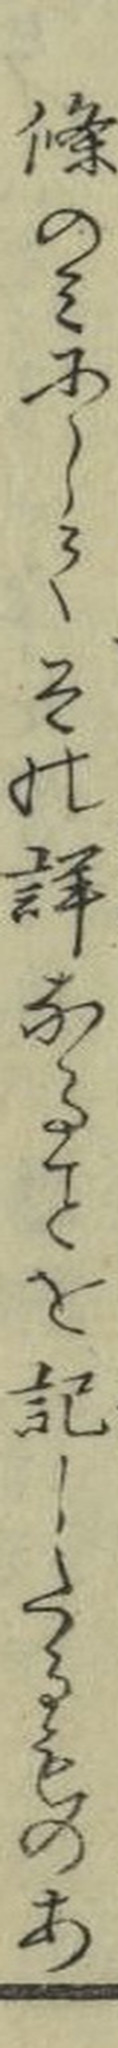条のみにして、その詳なることを記したるものあ
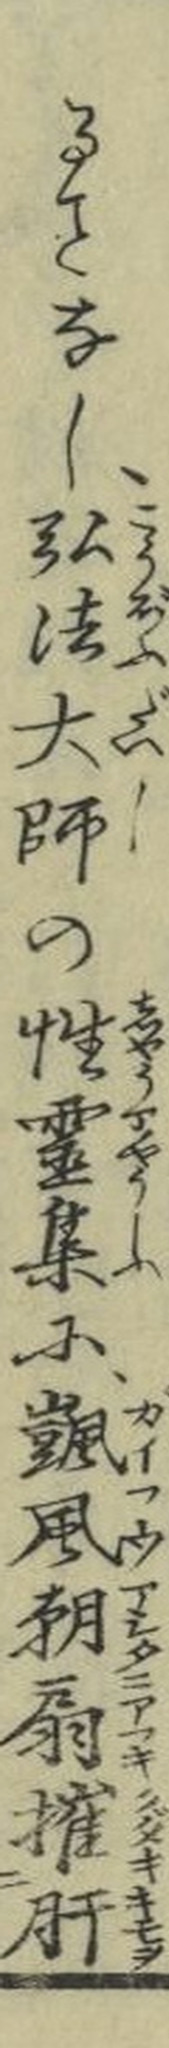ることなし、弘法大師の性霊集に凱風朝扇摧肝
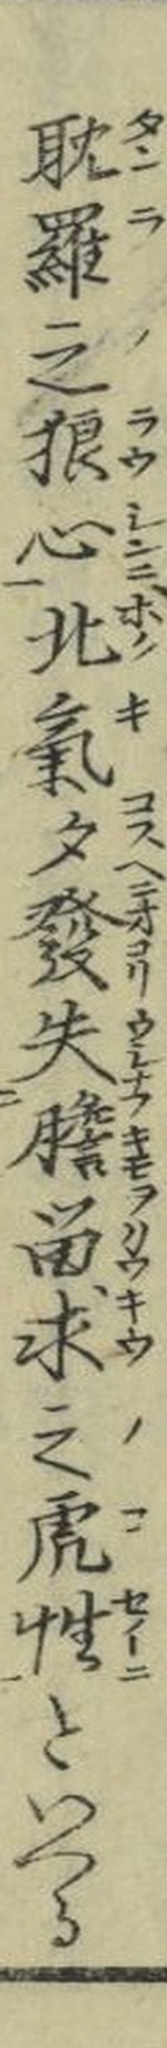耽羅之狼心、北気夕発失膽留求之虎性といへる
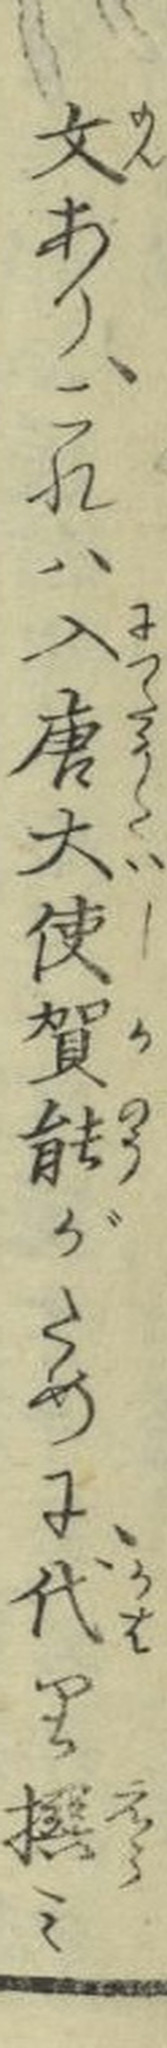文あり、これは入唐大使賀能がために、代り撰み
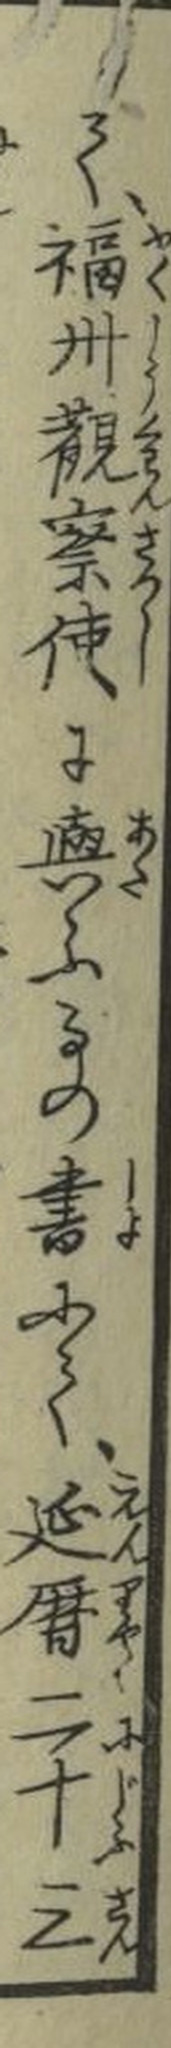て、福州観察使に与ふるの書にて、延暦二十三
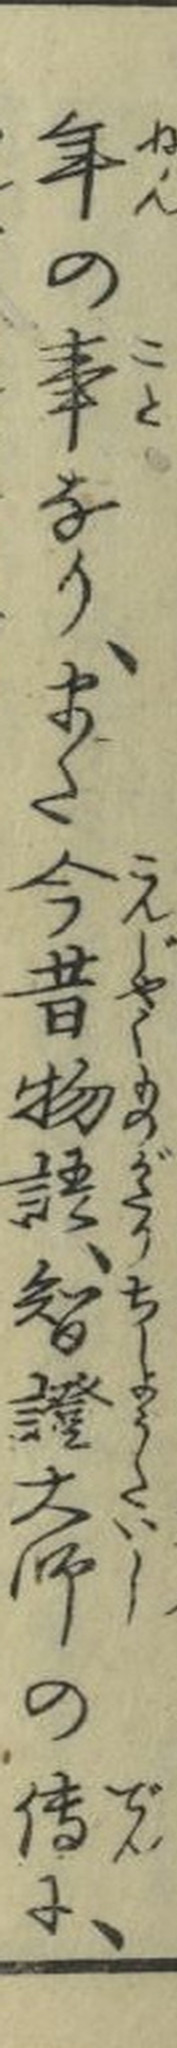年の事なり、また今昔物語、智証大師の伝に、
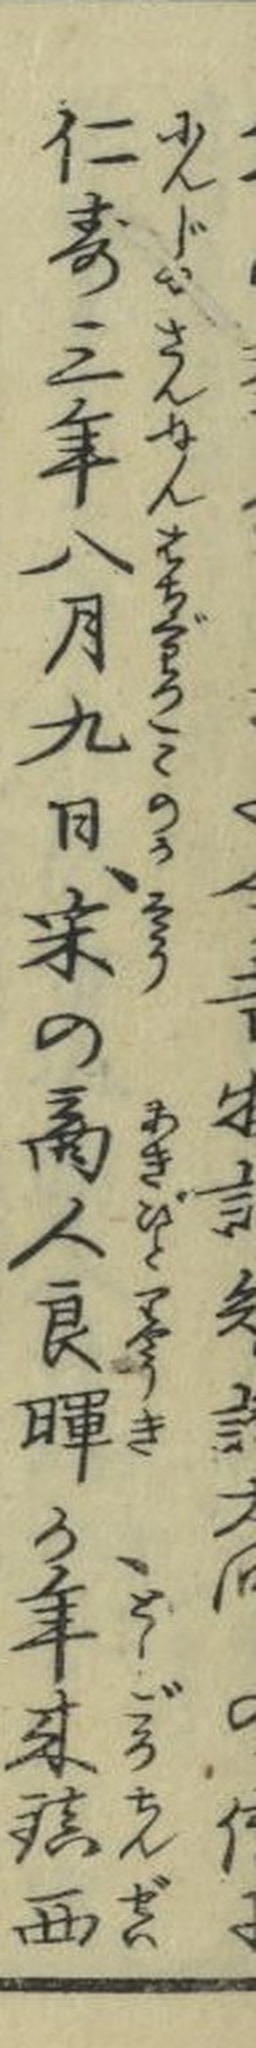仁寿三年八月九日、宋の商人良暉か、年来鎮西
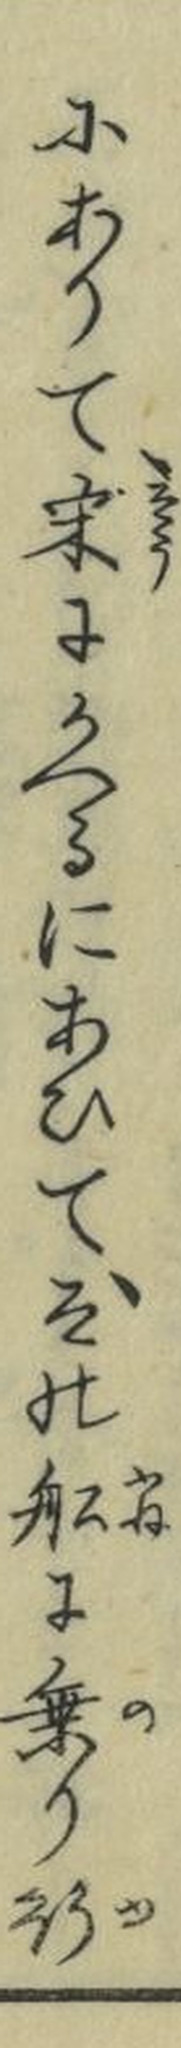にありて、宋にかへるにあひて、その船に乗り行
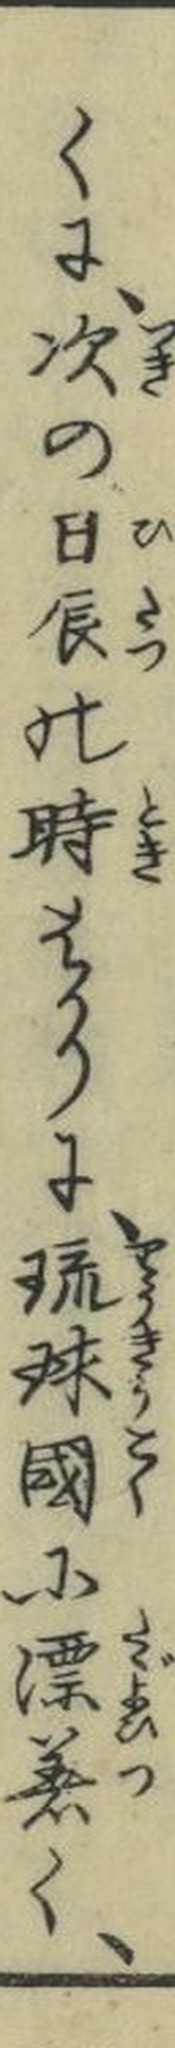くに、次の日辰の時はかりに、琉球国に漂着く、
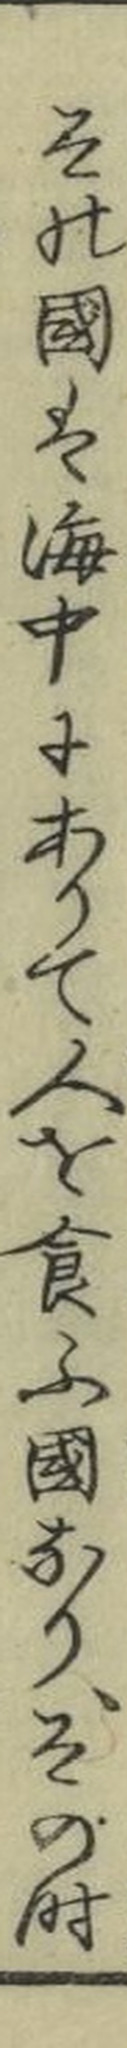その国は海中にありて人を食ふ国なり、その時
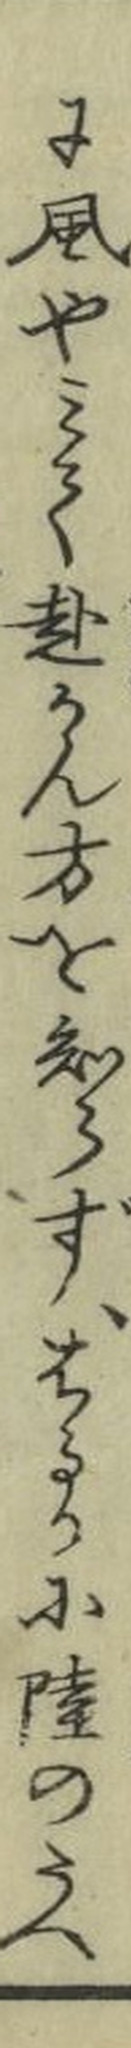に風やみて赴かん方を知らず、はるかに陸のうへ
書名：琉球入貢紀略
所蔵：University of the Ryukyus Library
